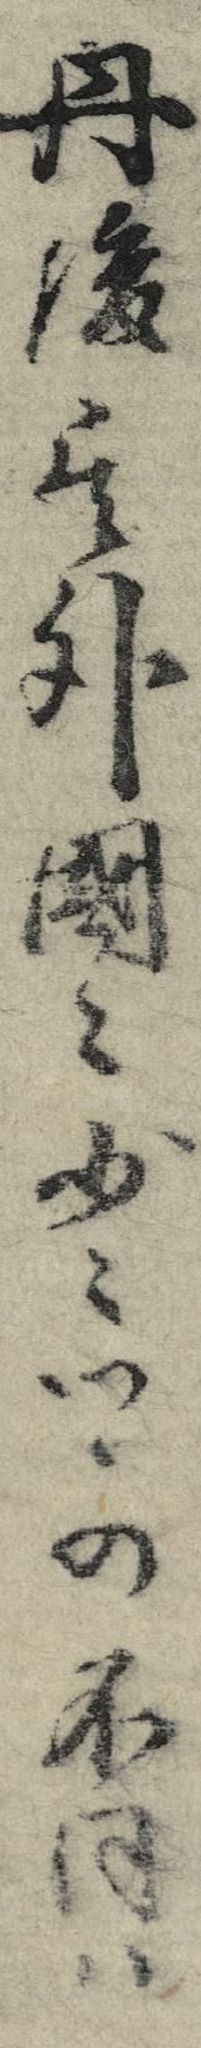丹後其外国々少々ツゝの不同ハ
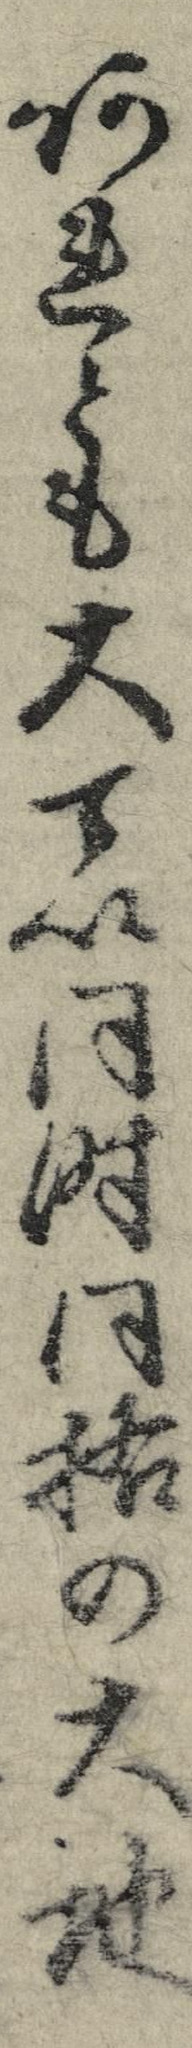あれとも大方以同時同様の大地
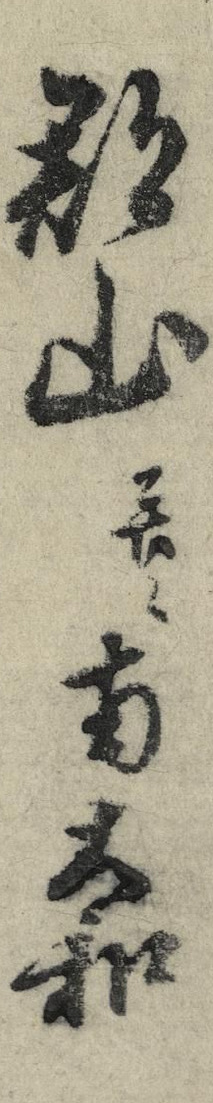郡山幷ニ南大和
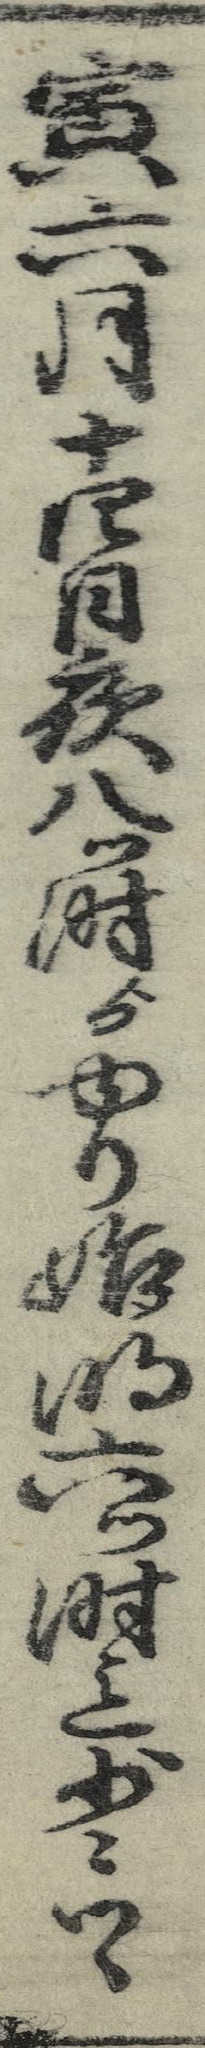寅六月十四日夜八ツ時ゟゆり始明六ツ時迄少々ツゝ
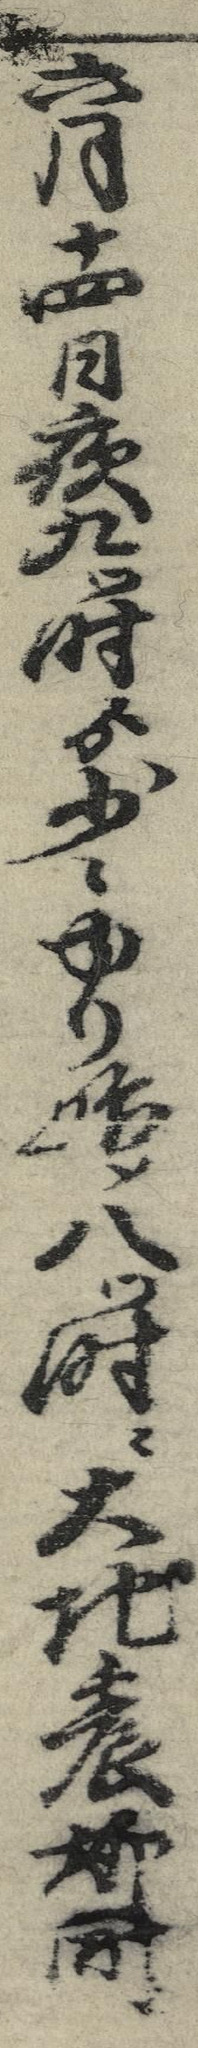六月十四日夜九ツ時ゟ少々ゆり始め八ツ時に大地震柳同
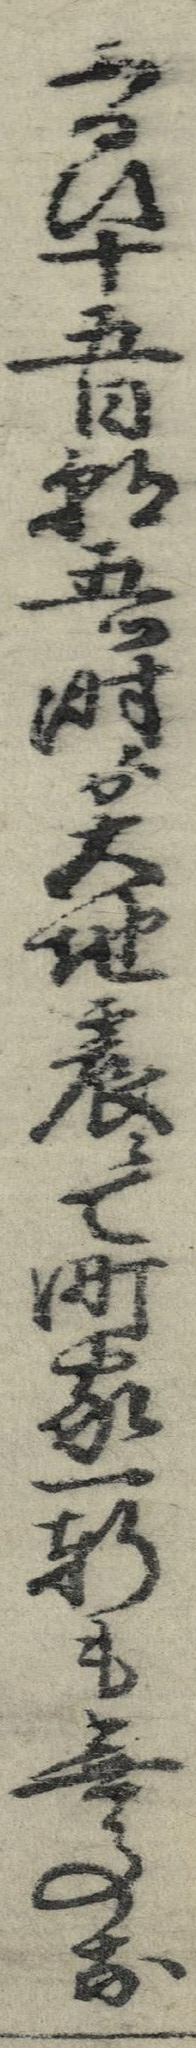ふるひ十五日朝五ツ時ゟ大地震にて町家一軒も無事な
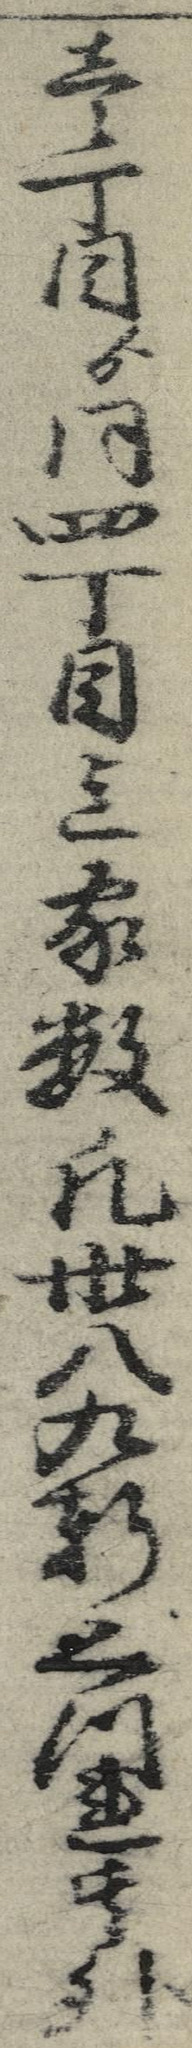壱丁目ゟ同四丁目迄家数凡卅八九軒くつれ其外
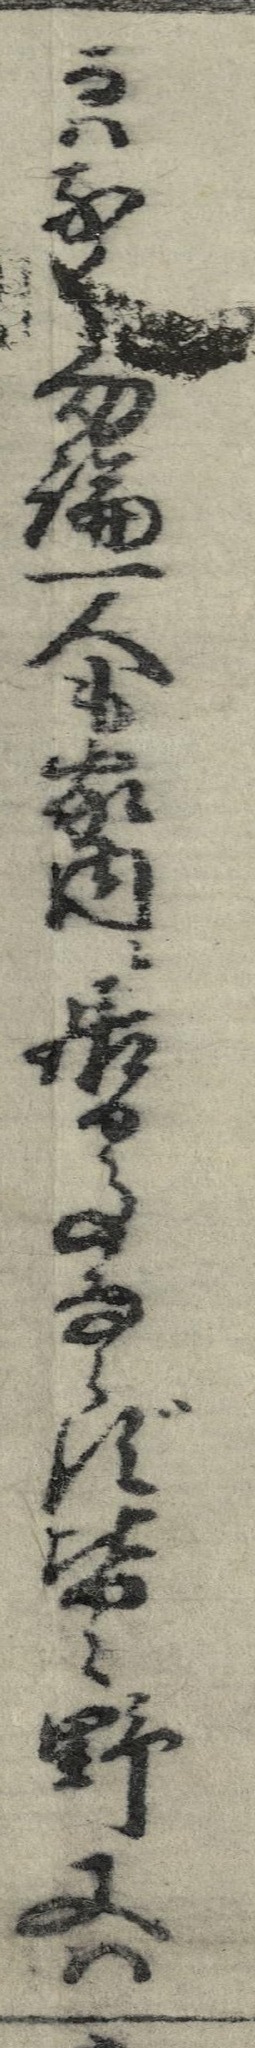るはなく勿論一人も家内に居る事ならず皆々野又は
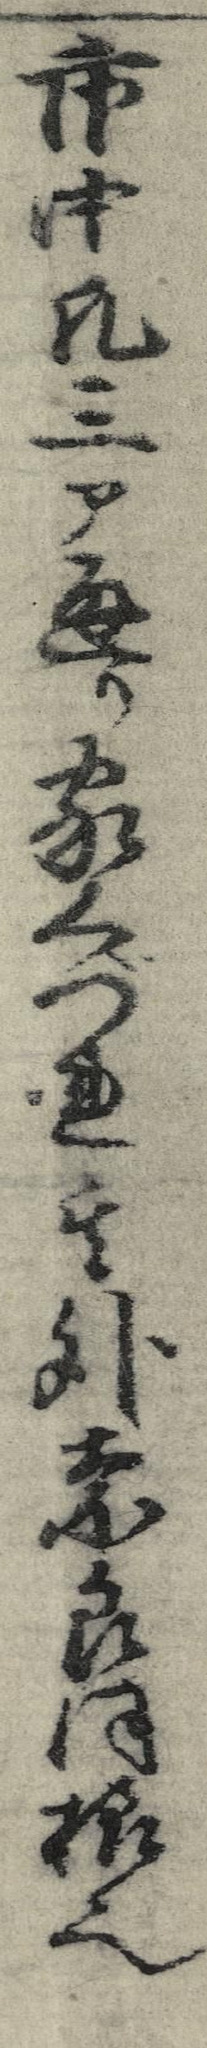市中凡三部通り家くづれ其外奈良同様也
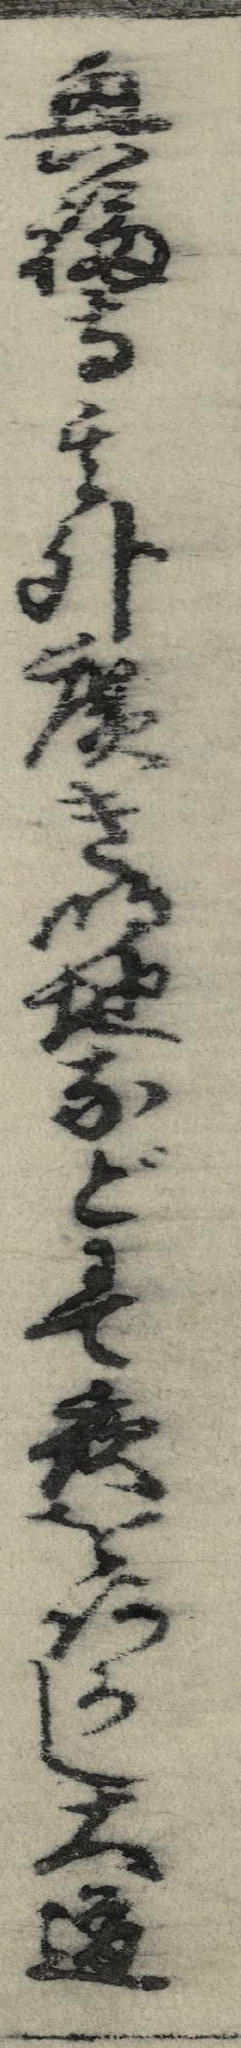興福寺其外広き明地などにて夜をあかし大道
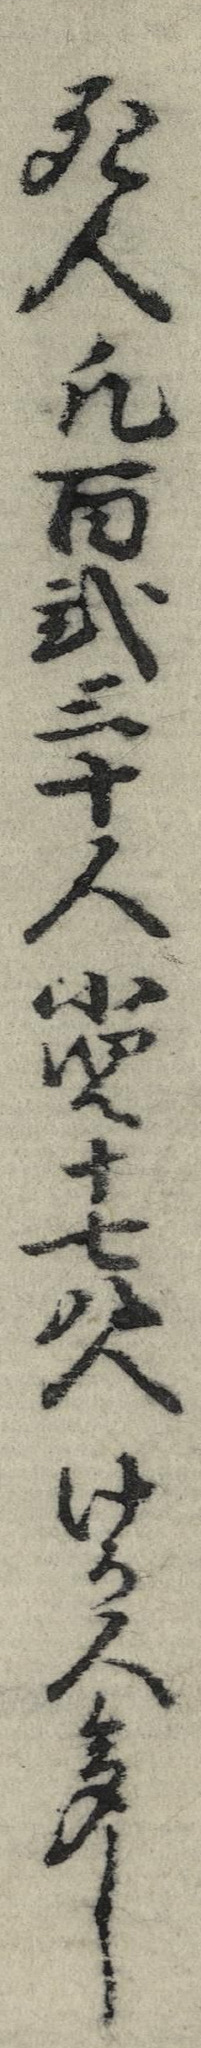死人凡百弐三十人小児十七八人けか人多し
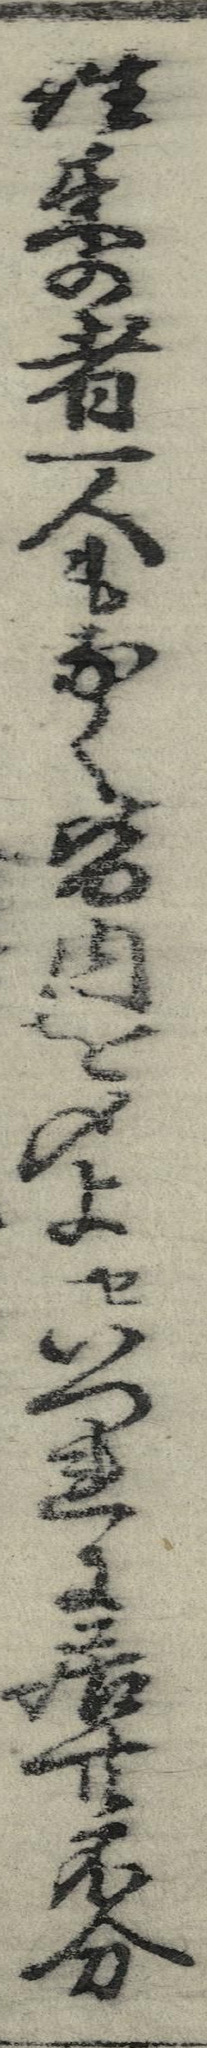往来の者一人もなく皆門を〆よせいつれに居共不分
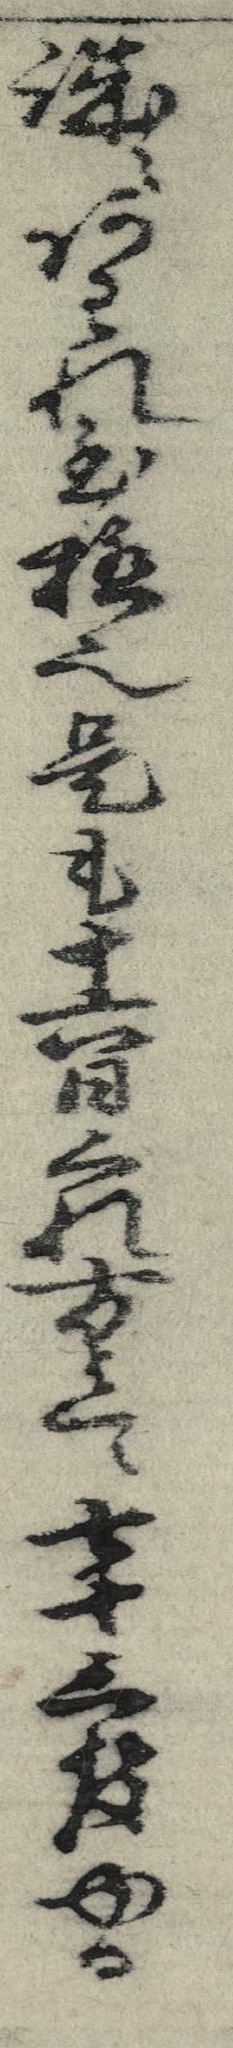誠にあわれ至極也是も十六日くれ方迄に七十三度ゆる
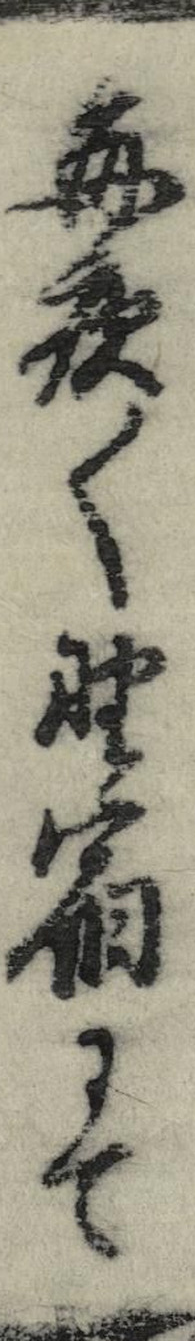毎夜〳〵野宿にて
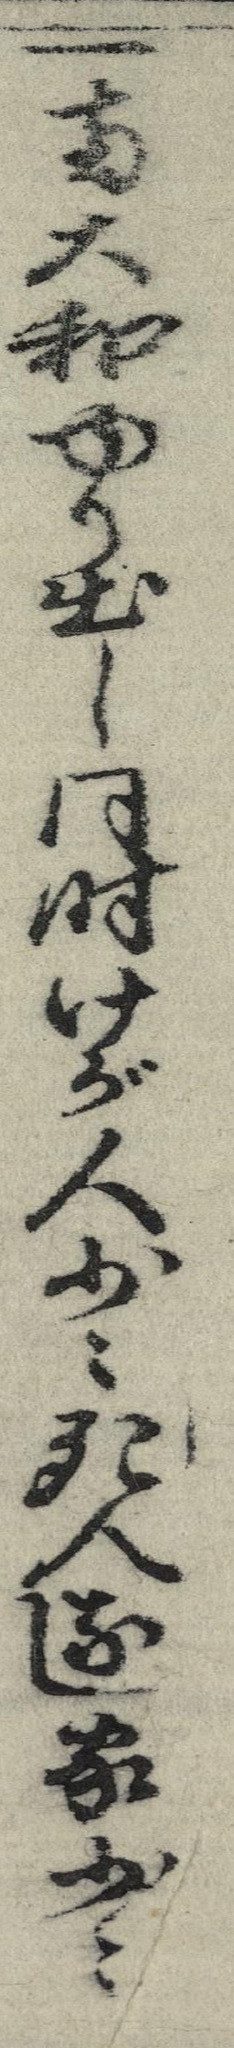一南大和ゆり出し同時けが人少々死人なし家少々
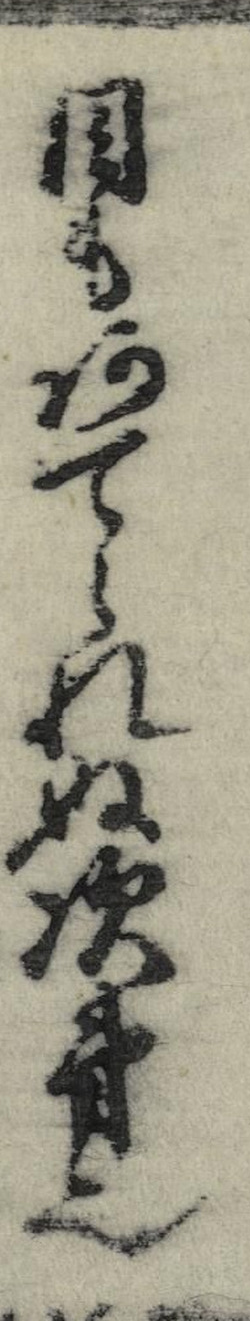目もあてられぬ次第也
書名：聞書　諸國大地震并ニ出火
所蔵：東京大学地震研究所図書室 Earthquake Research Institute Library, The University of Tokyo, JAPAN
